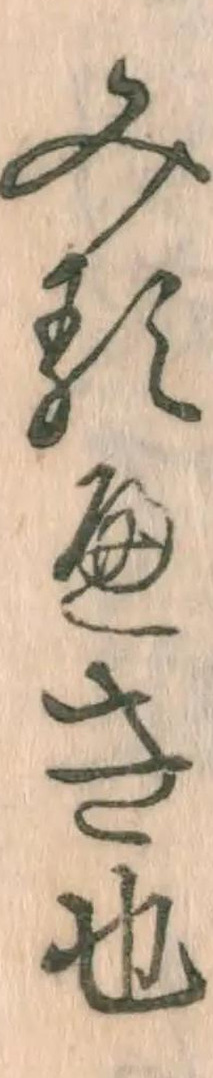みるへき也
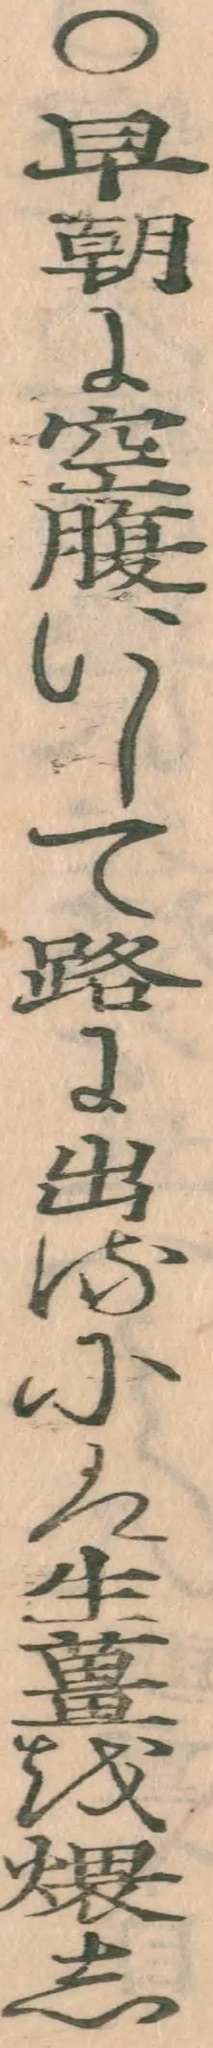〇早朝に空腹にして路に出るには生薑を煨し
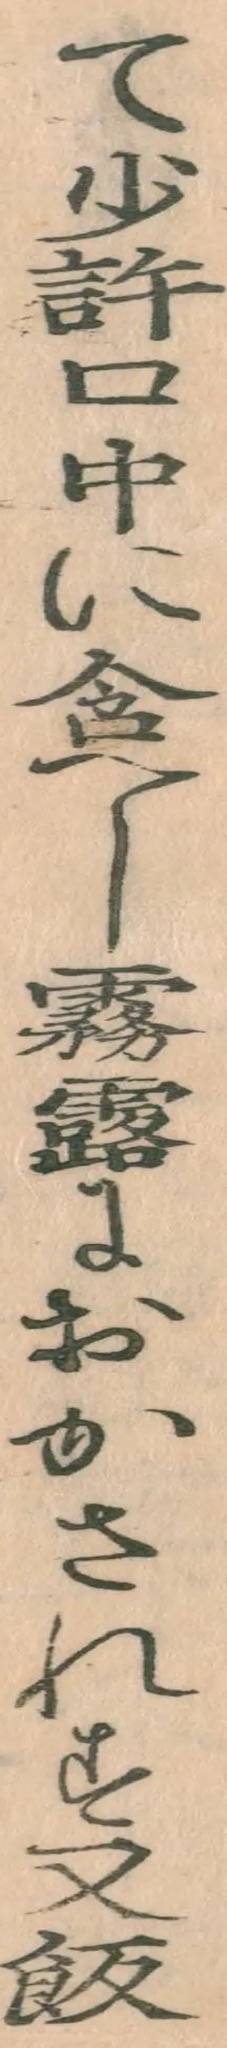て少許口中に含へし霧露におかされす又飯
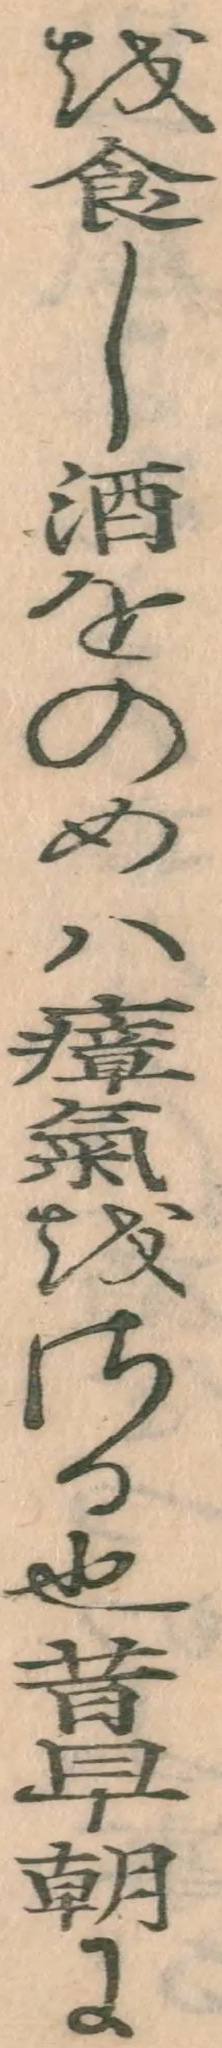を食し酒をのめは瘴気をさる也昔早朝に
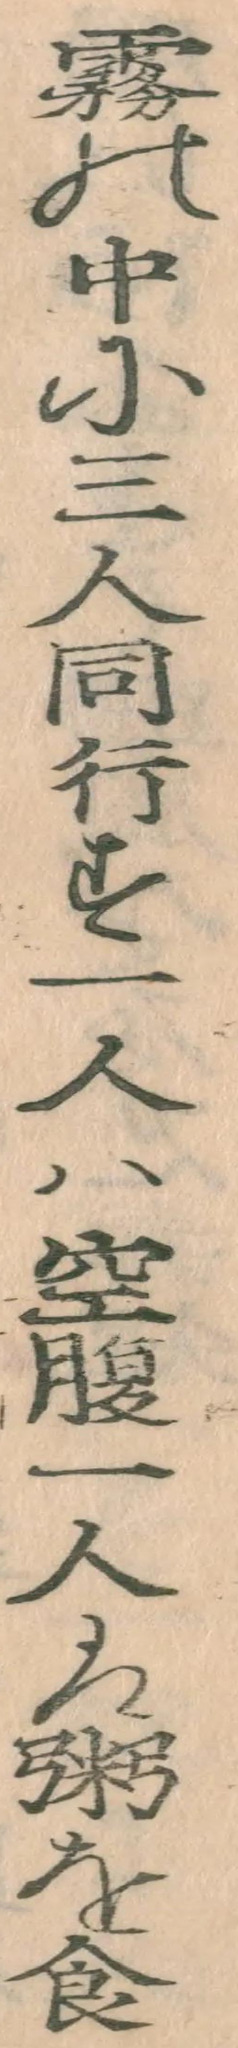霧の中に三人同行す一人は空腹一人は粥を食
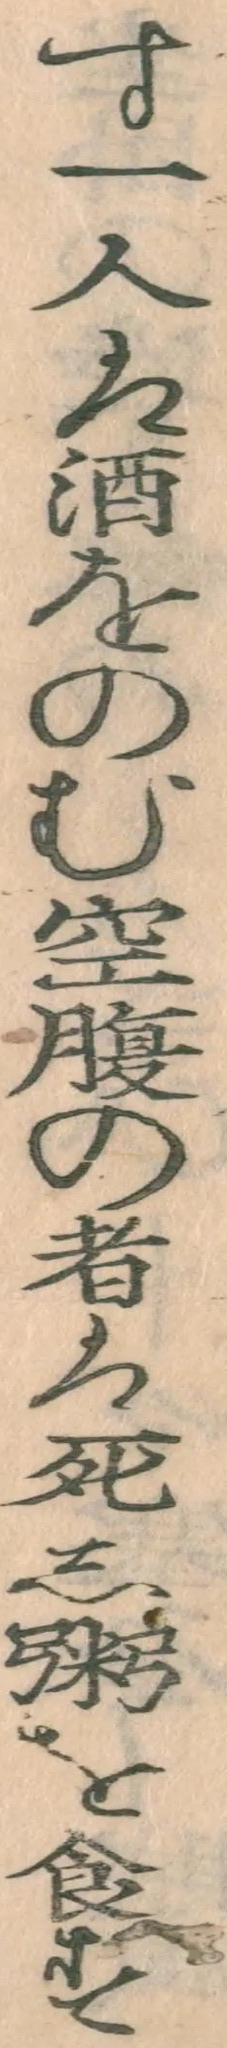す一人は酒をのむ空腹の者は死し粥を食す
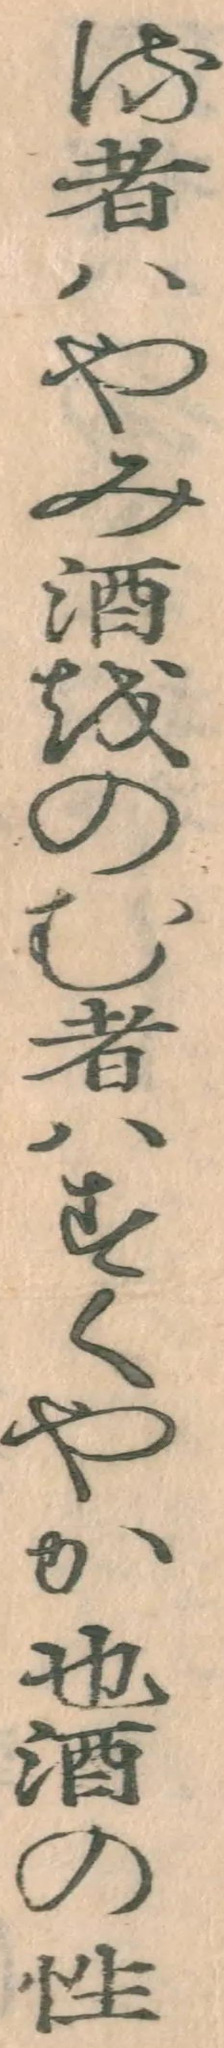る者はやみ酒をのむ者はすくやか也酒の性
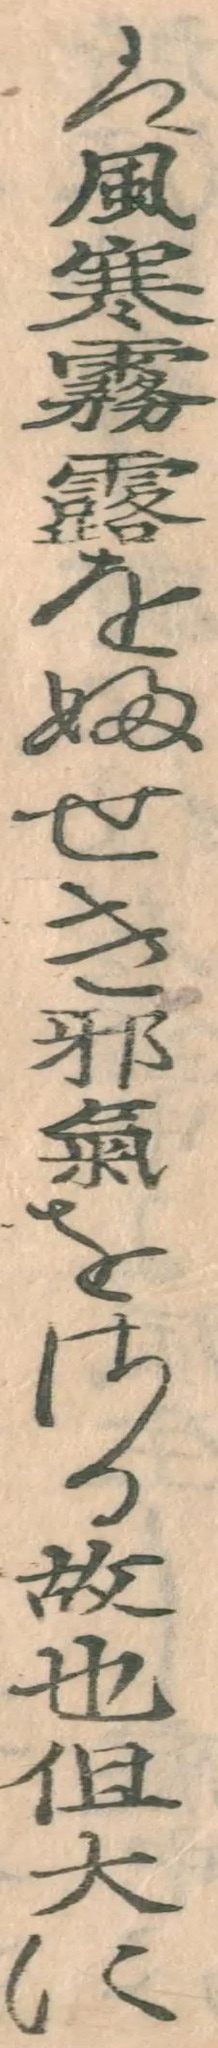は風寒霧露をふせき邪気をさる故也但大に
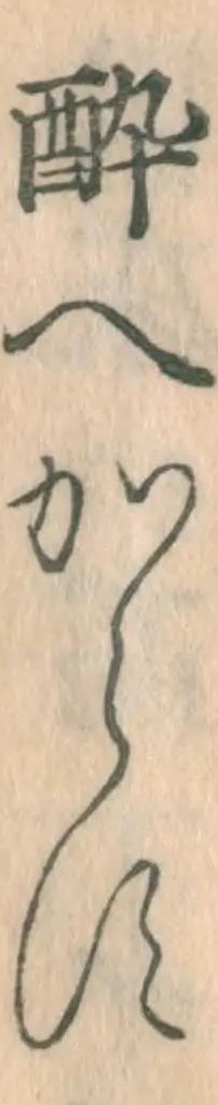酔へからす
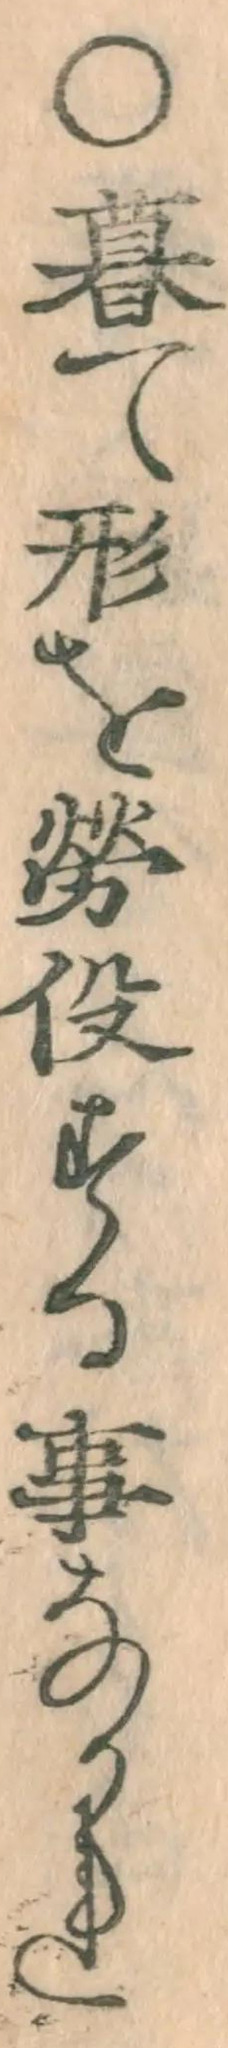〇暮て形を労役する事なかれ

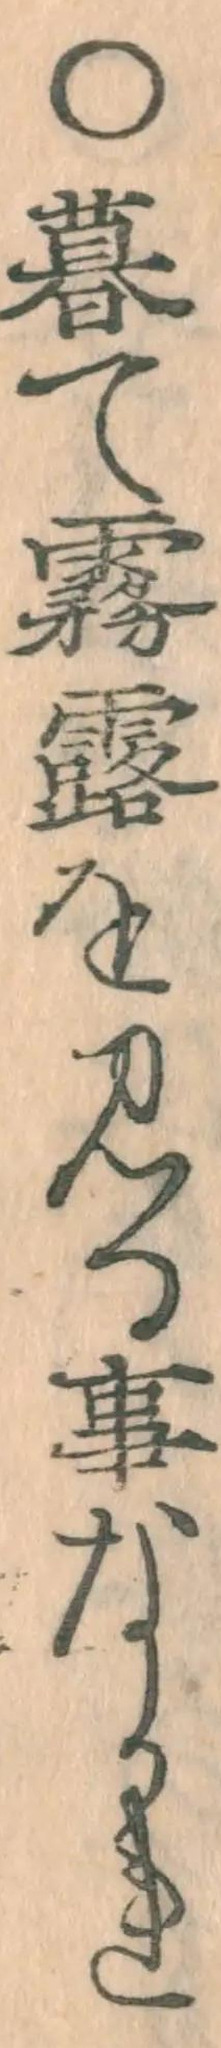〇暮て霧露をみる事なかれ
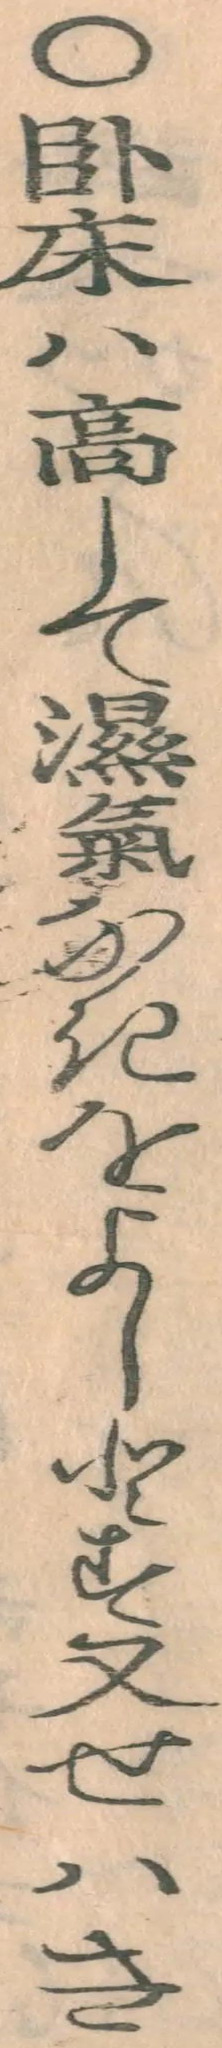〇臥床は高して湿気なきをよしとす又せはき
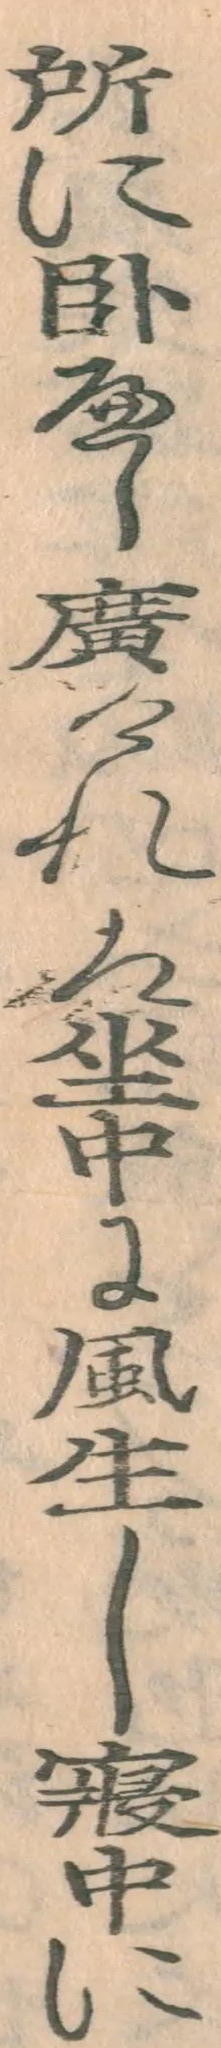所に臥へし広けれは坐中に風生し寝中に
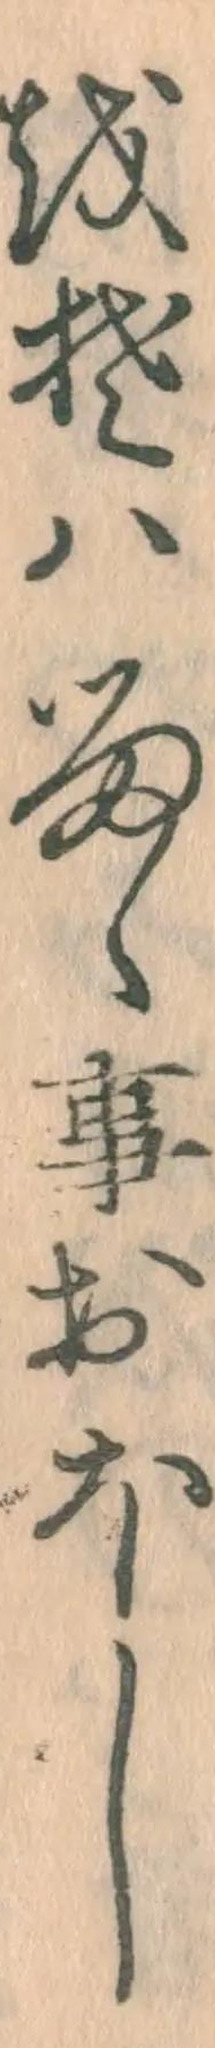おそはるゝ事おほし
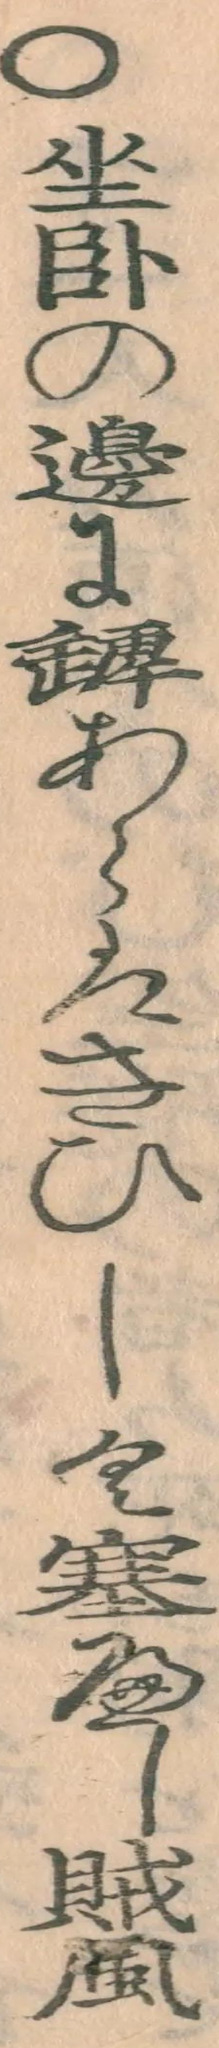〇坐臥の辺にあらはきひしく寒へし賊風
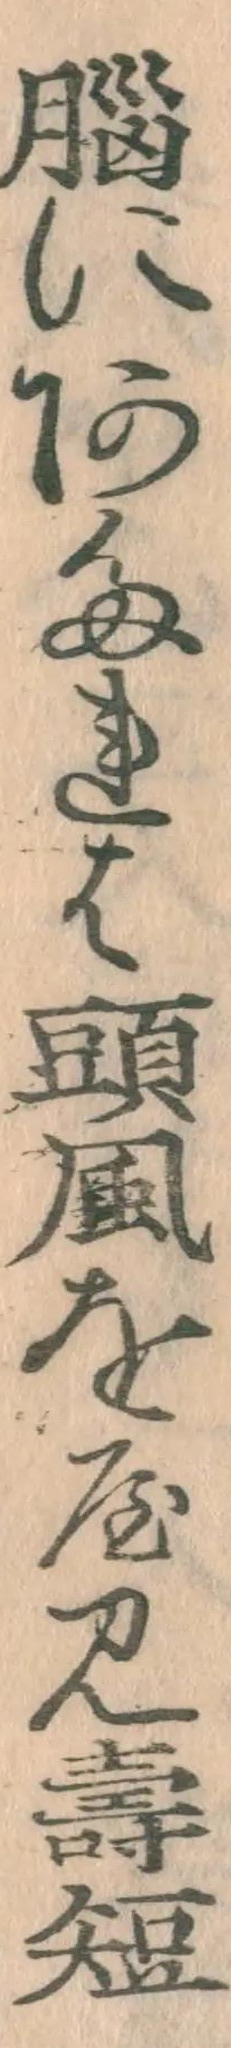脳にあたれは頭風をやみ寿短
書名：延壽撮要
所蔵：国立国会図書館 National Diet Library, JAPAN
